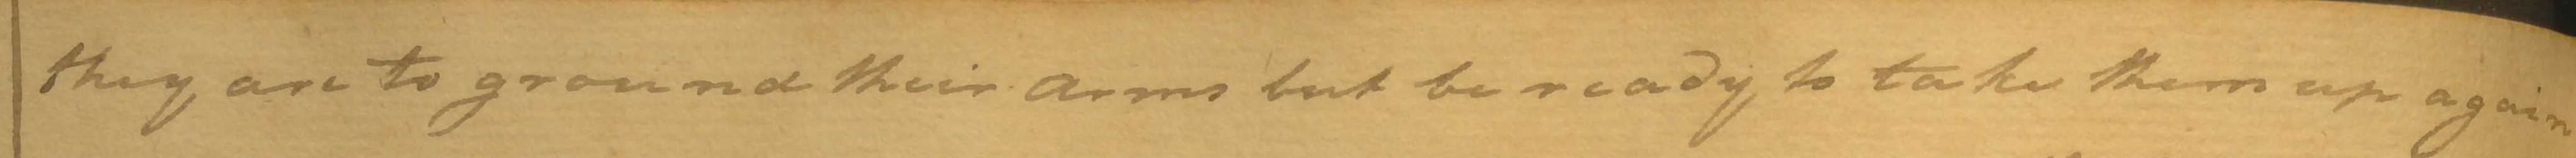they are to ground their arms but be ready to take them up again
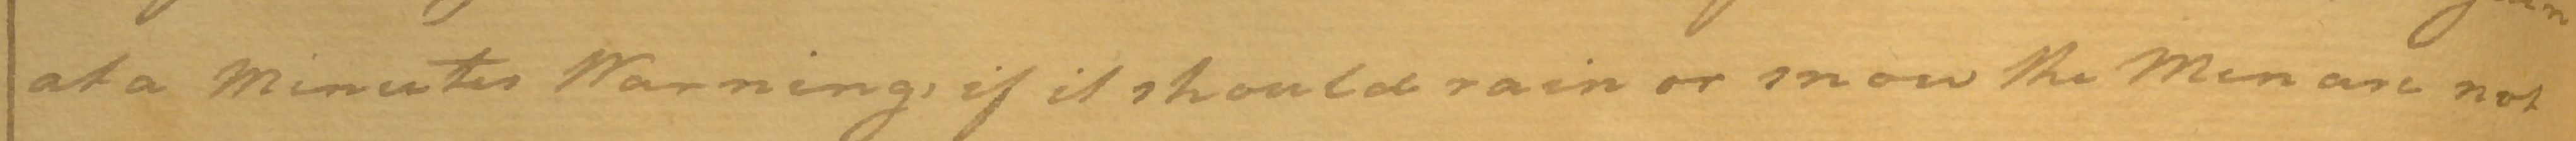at a Minutes Warning, if it should rain or snow the Men are not
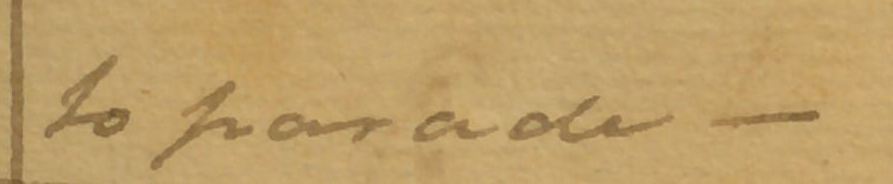to parade-
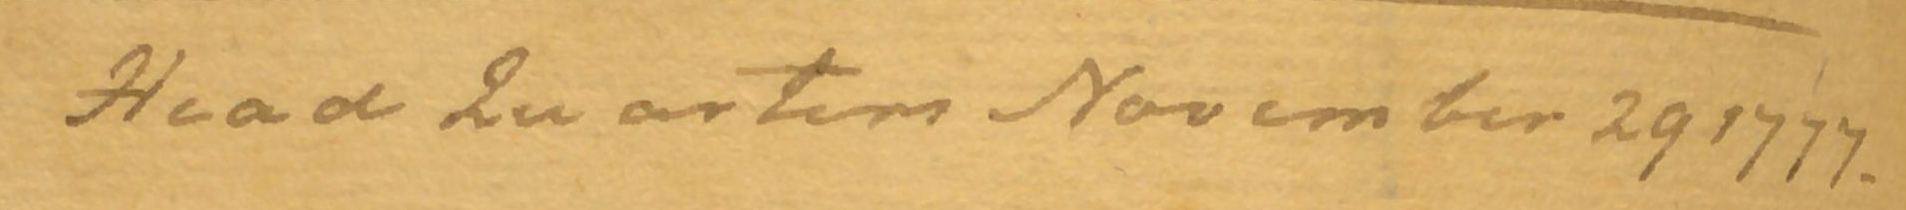Head Quarters November 29 1777.
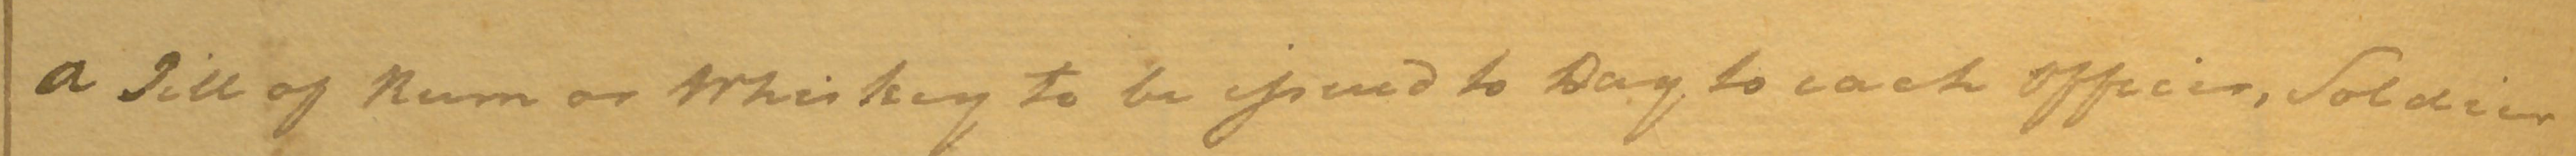A gill of Rum or Whiskey to be issued to Day to each officer, Soldier
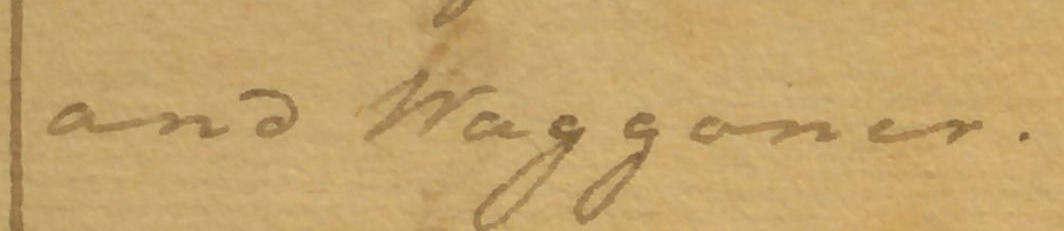and Waggoner.
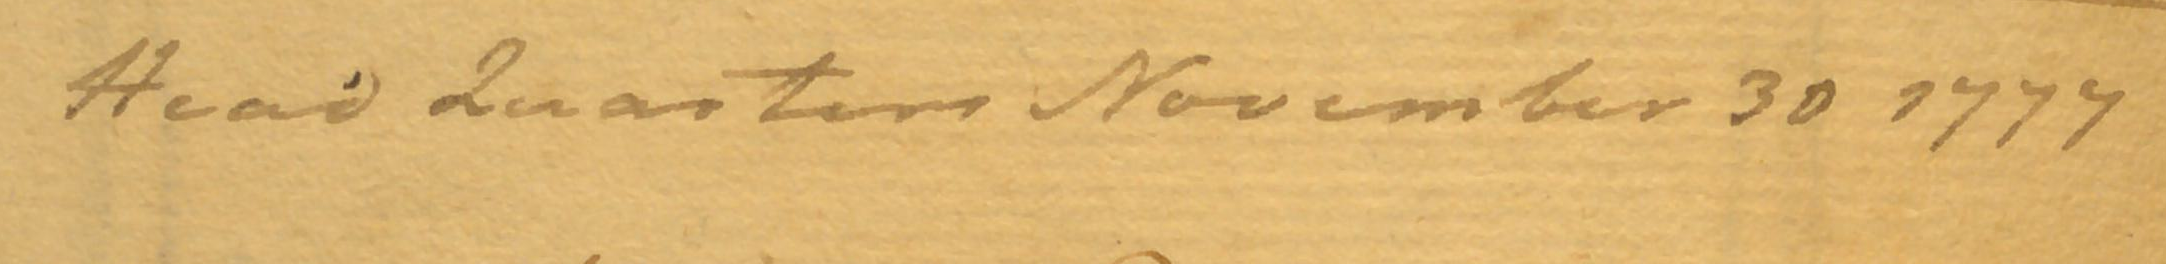Head Quarters November 30 1777
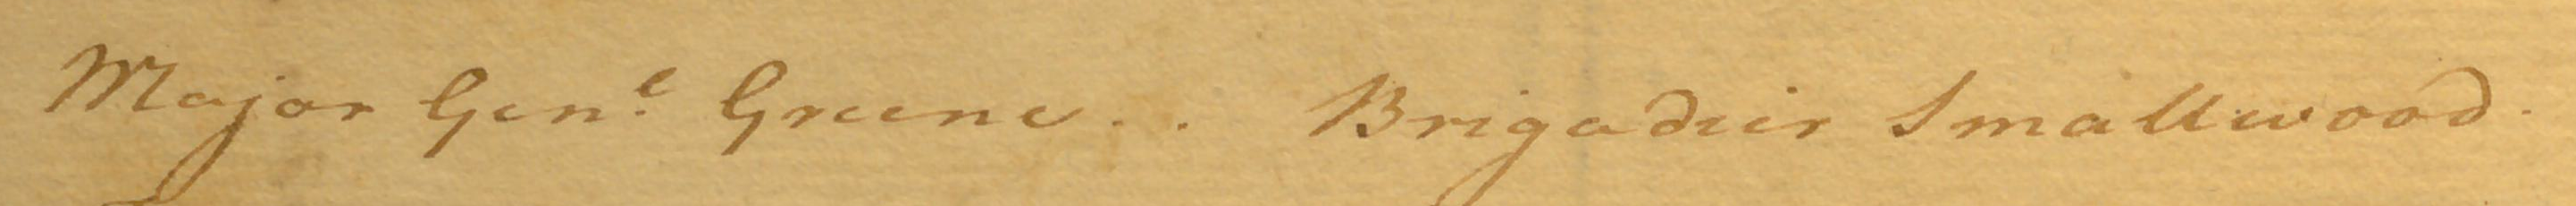Major Gen^l. Greene.. Brigadier Smallwood.
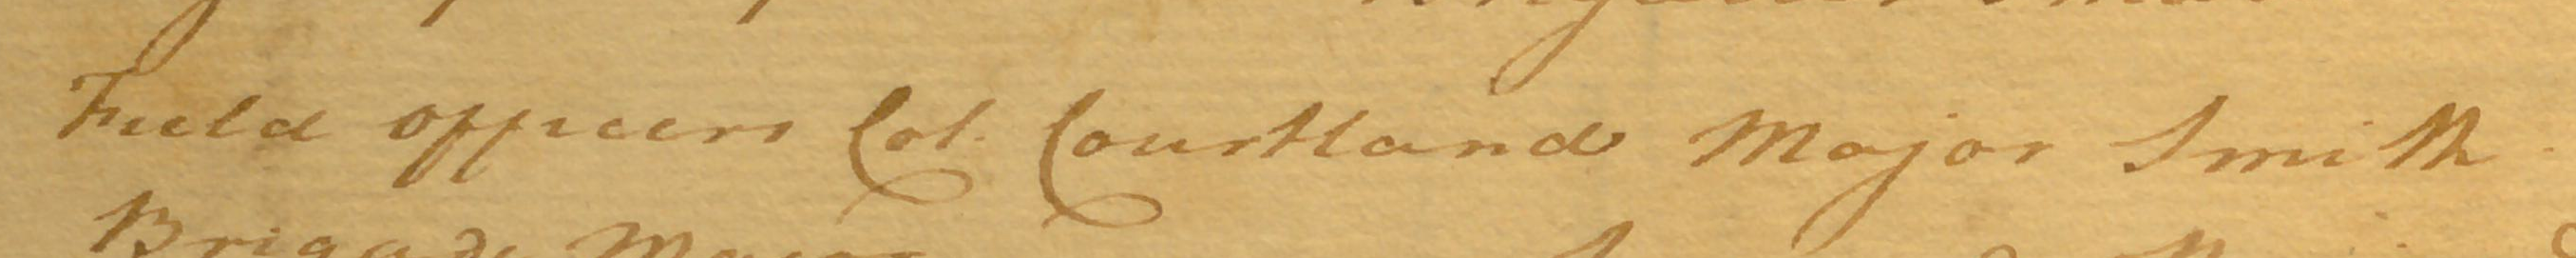Field officers Col. Courtland Major Smith
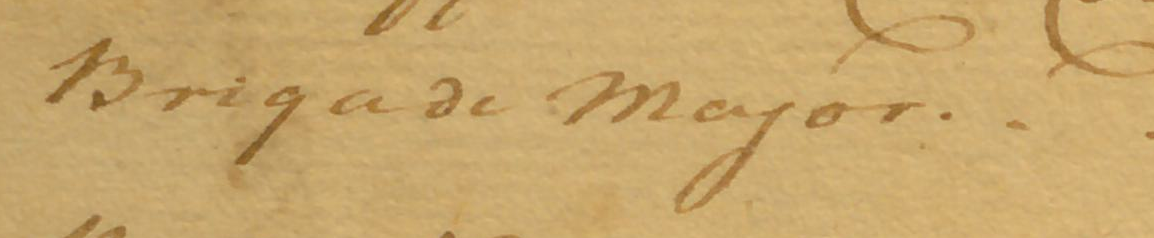Brigade Major. .
